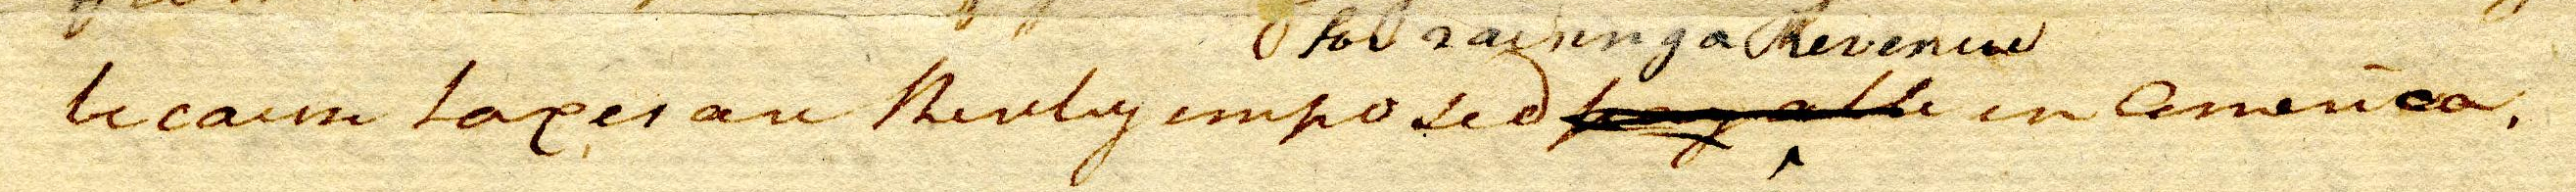because taxes are heavily imposed ^ in America,
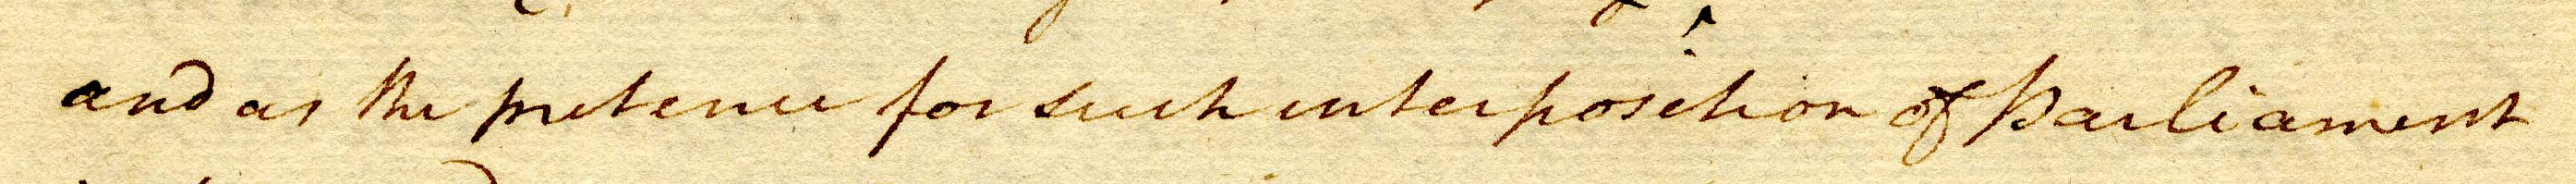and as the pretence for such interposition of Parliament
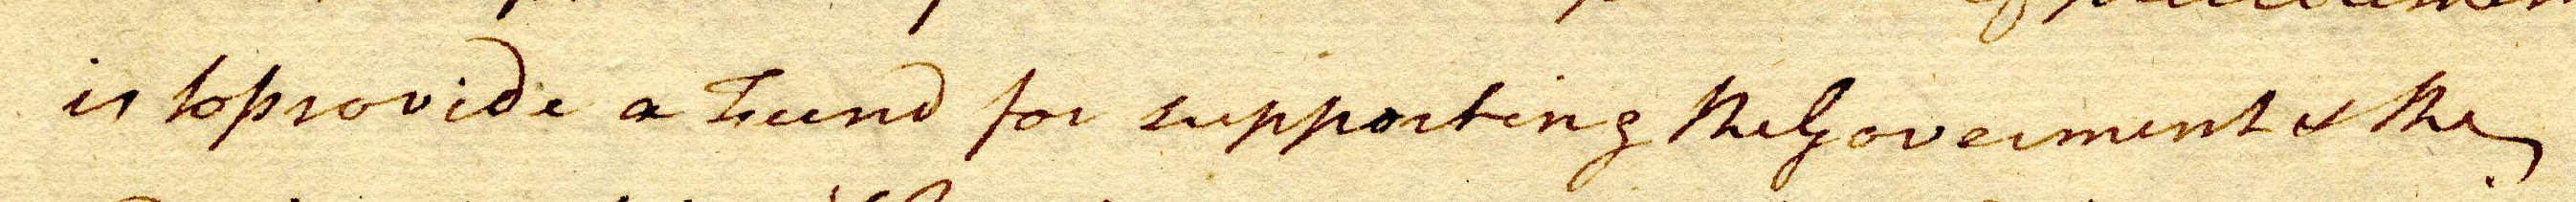is toprovide a Fund for supporting the Goverment & the
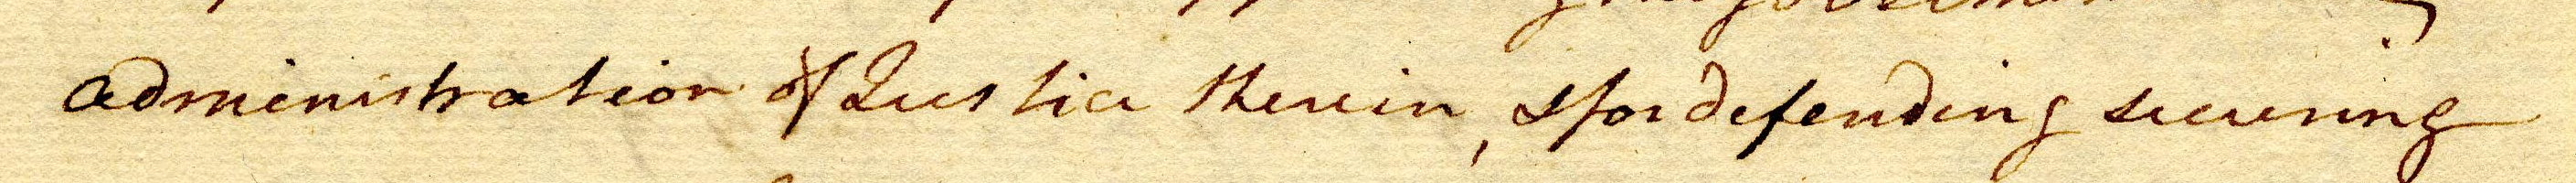administration of Justice therein, & for defending securing
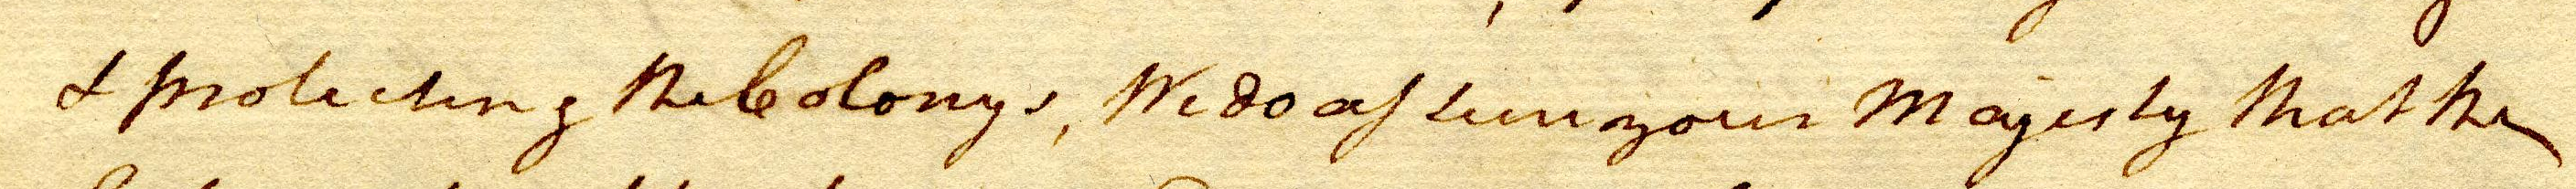& protecting the Colonys, We do assure your Majesty that the
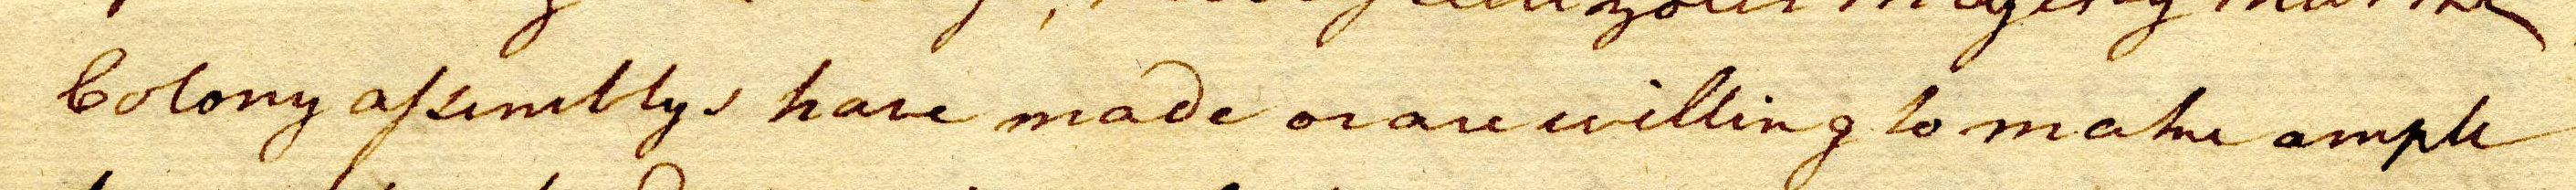Colony assemblys have made or are willing to make ample
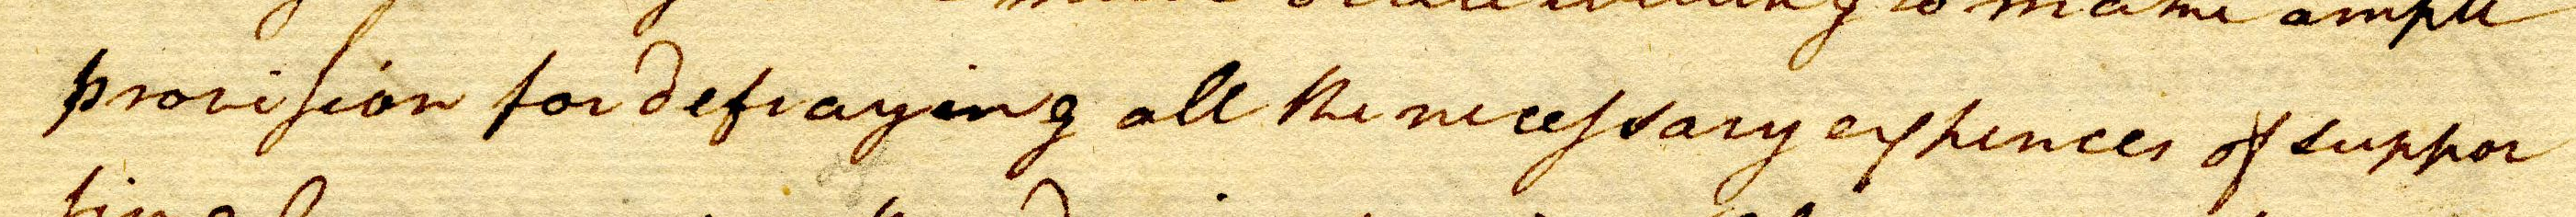provision for defraying all the necessary expences of suppor
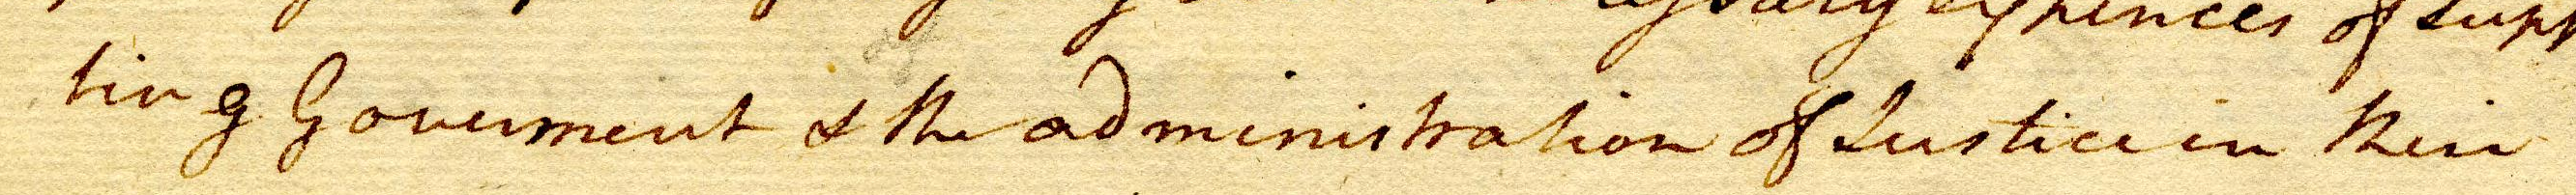ting Goverment & the administration of Justice in their
